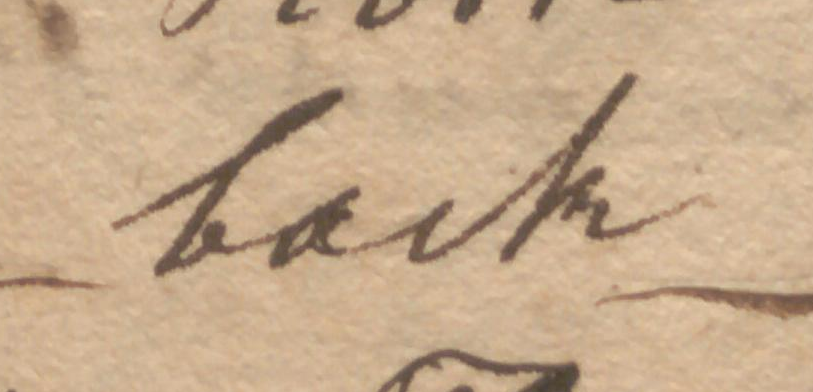back
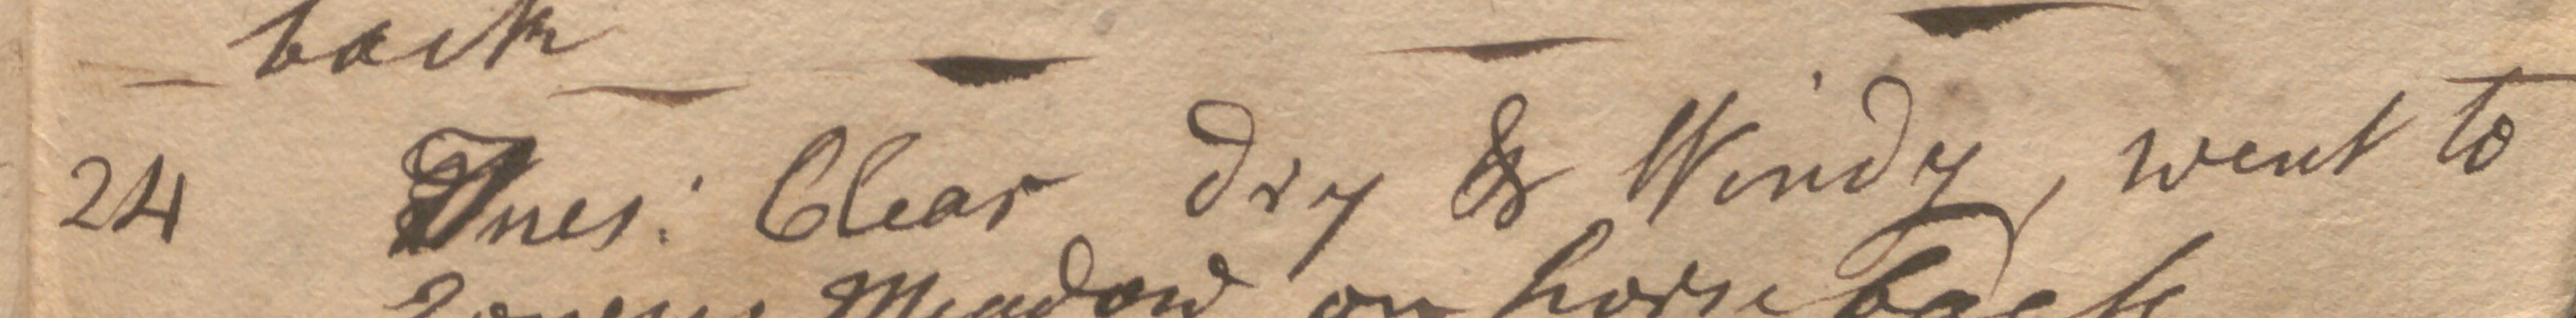24 Tues: Clear dry & Windy, went to
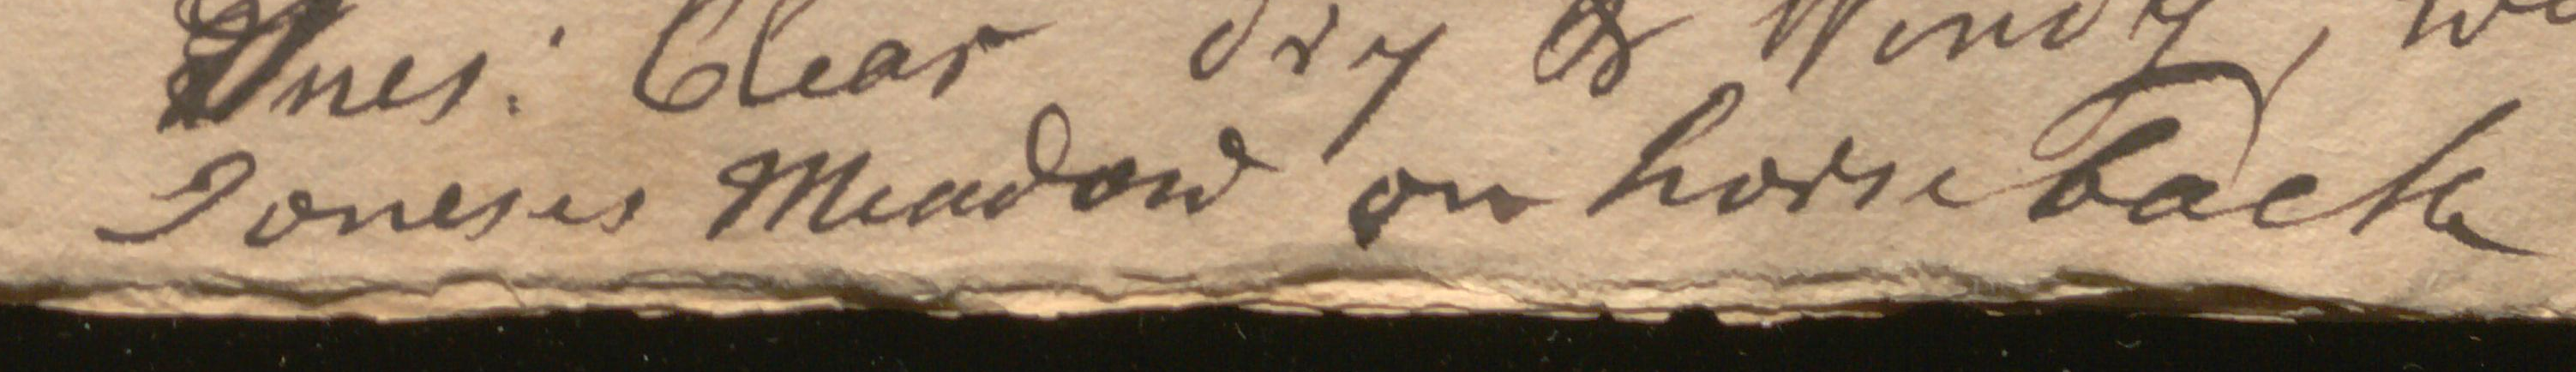Joneses Meadow on horse back
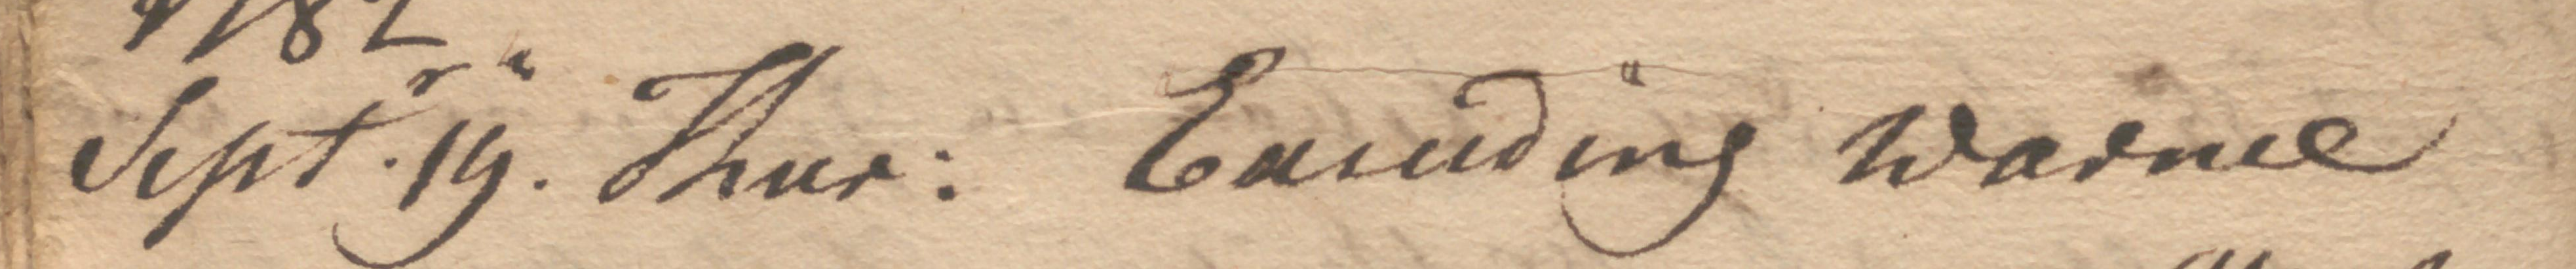Sept^r. 19^h. Thur: Exceeding warme
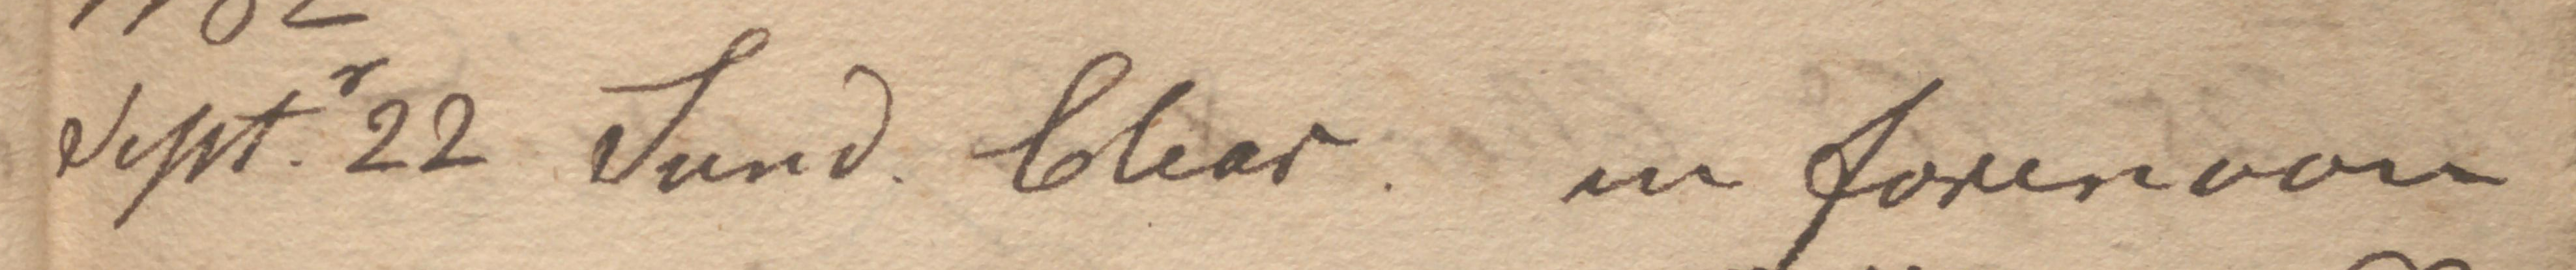Sept^r. 22 Sund. Clear. in forenoon
